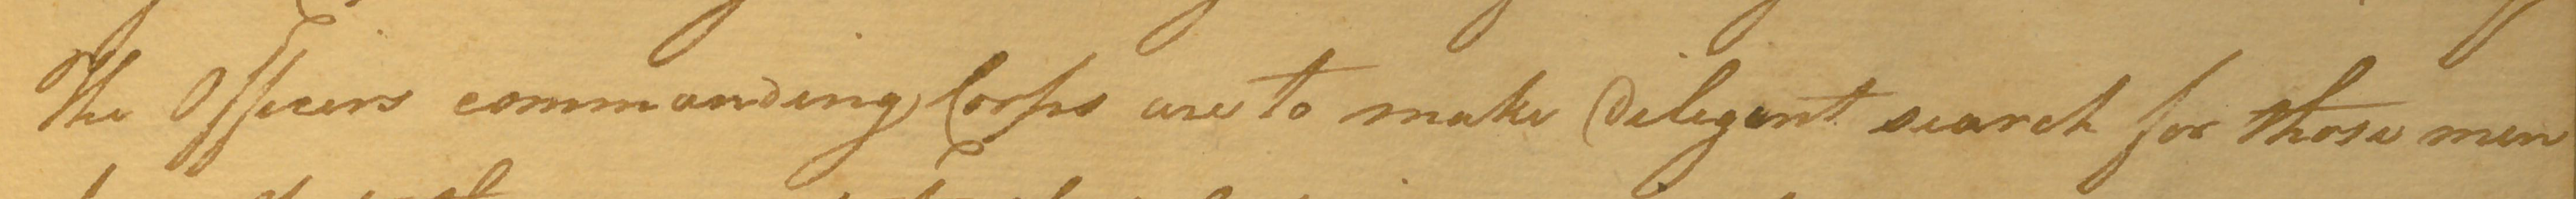The Officers commanding Corps are to make diligent search for those men
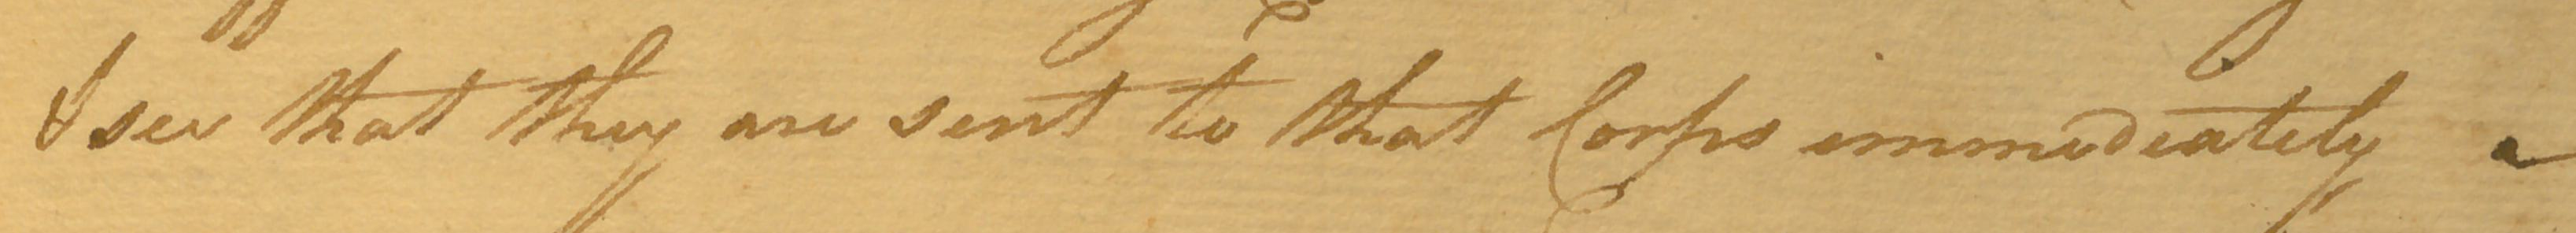& see that they are sent to that Corps immediately.
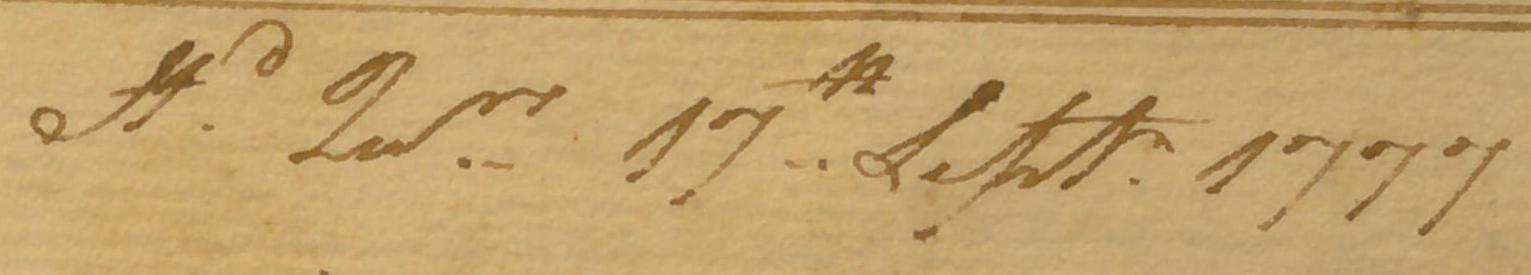H^d. Qu^rs. 17^th. Sept^r. 1777
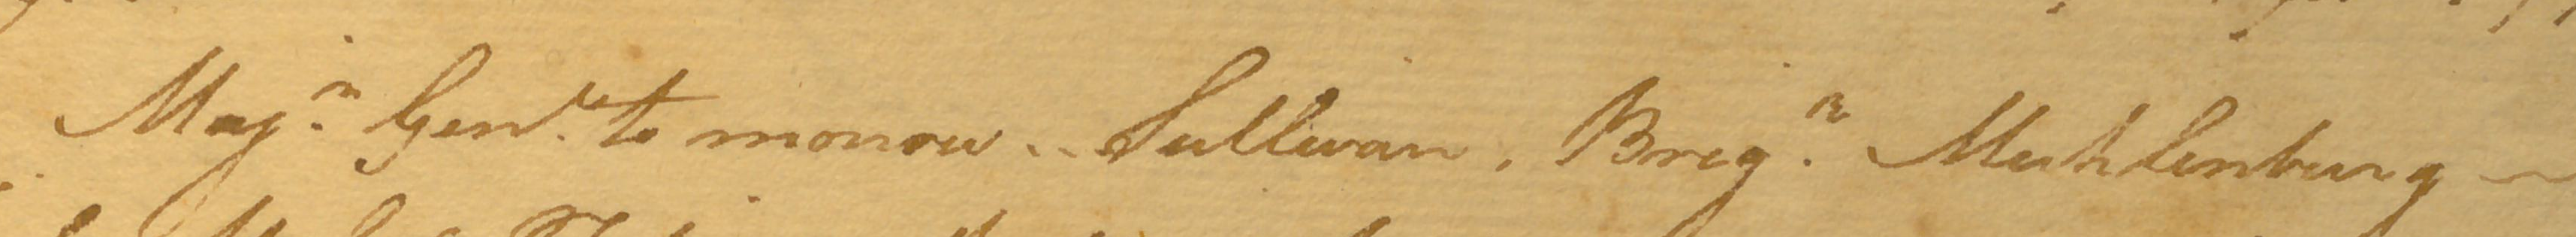Maj^r. Gen^l. to morrow.. Sullivan. Brig^r. Muhlenburg
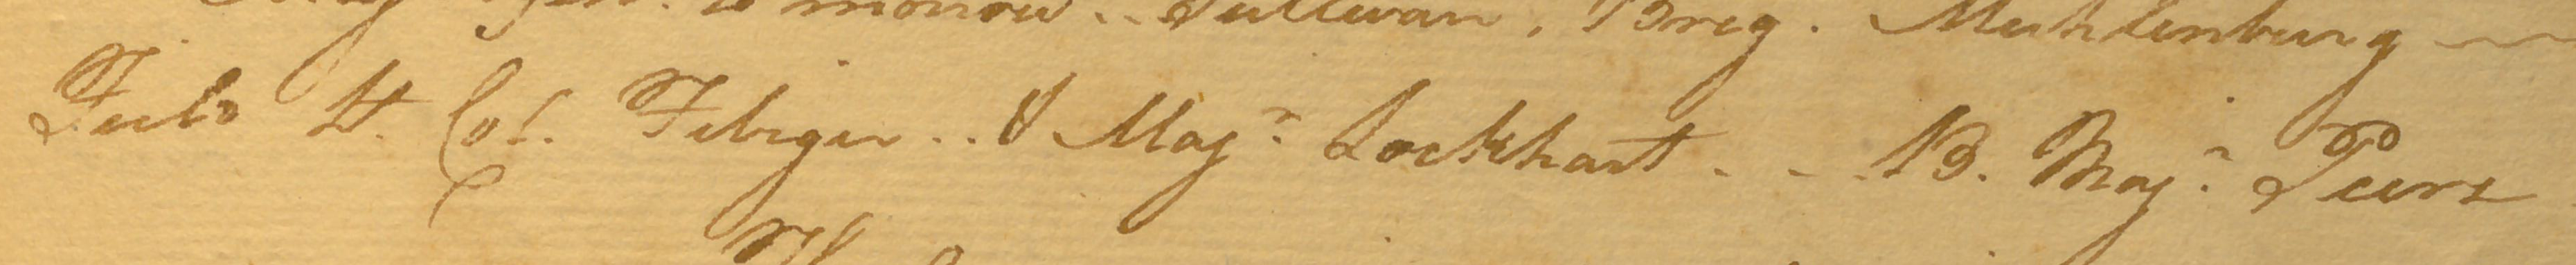Field Lt. Col. Febiger.. & Maj^r. Lockhart.. B. Maj^r. Pears
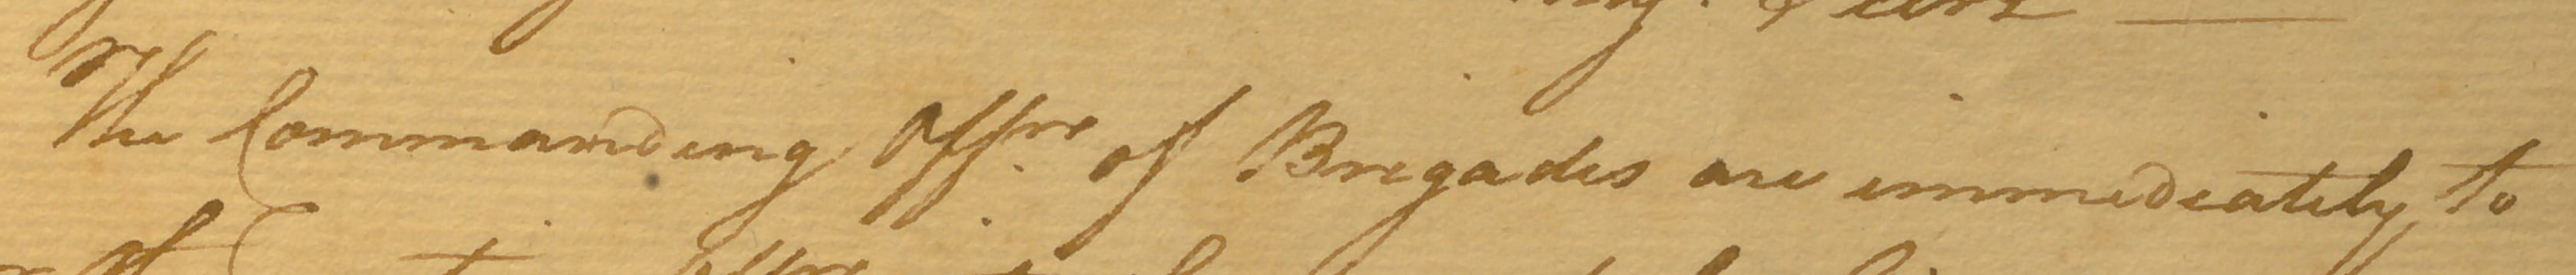The Commanding Off^rs. of Brigades are immediately to
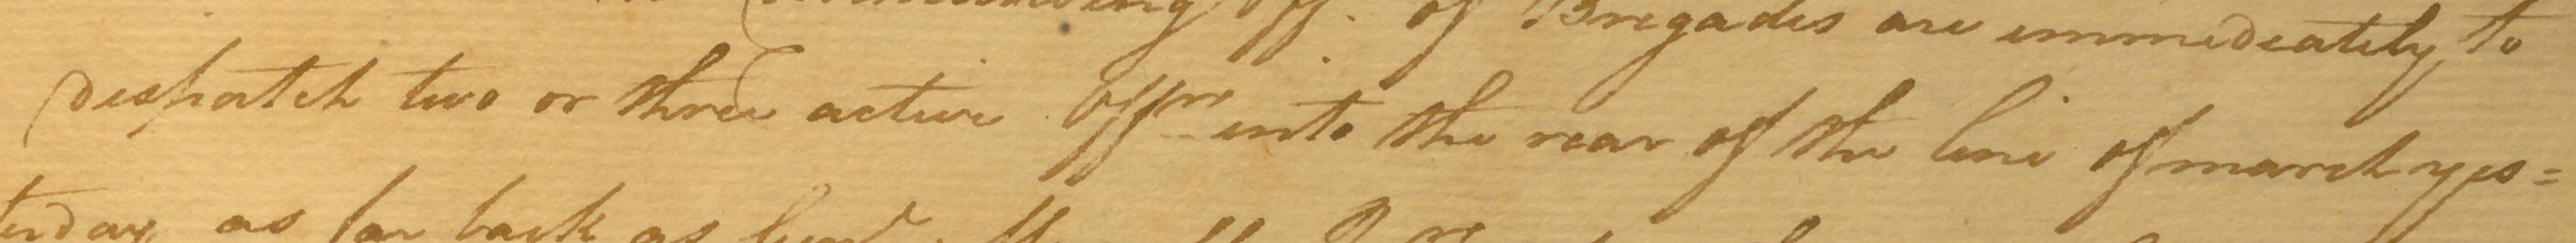dispatch two or three active Off^rs into the rear of the line of march yes-
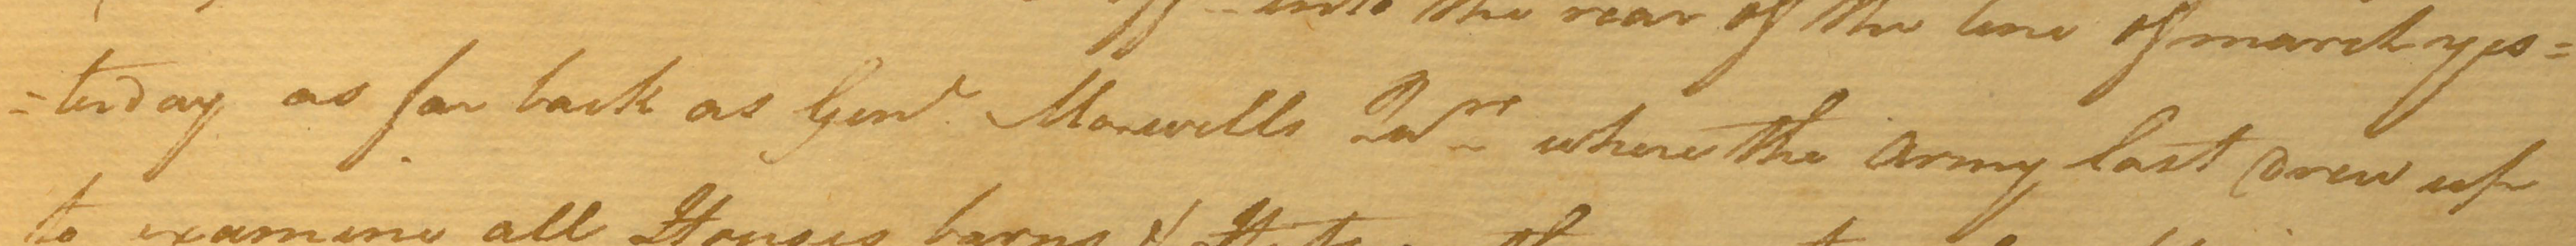-terday as far back as Gen^l Maxwells Qu^rs where the army last drew up
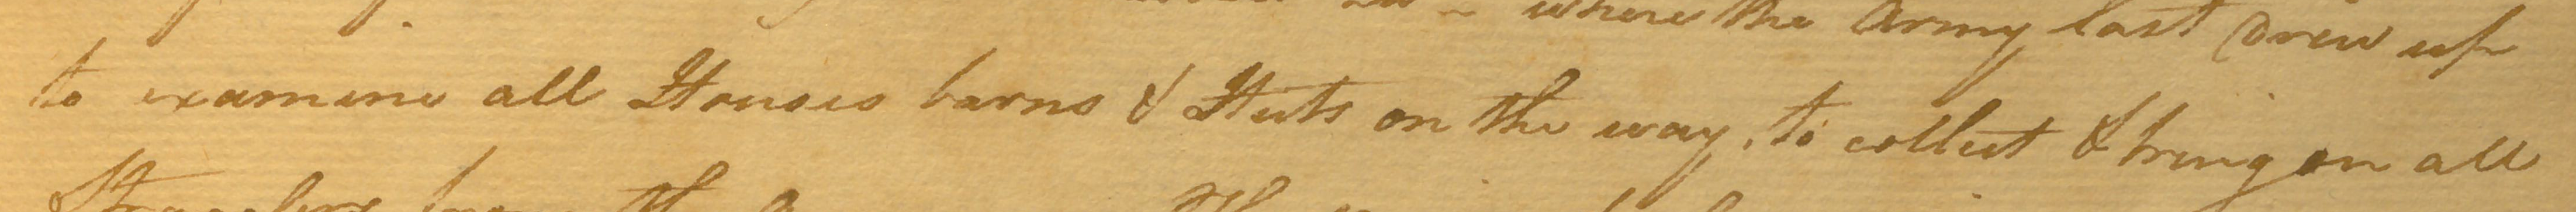to examine all Horses barns 7 Huts on the way, to collect & bring on all
